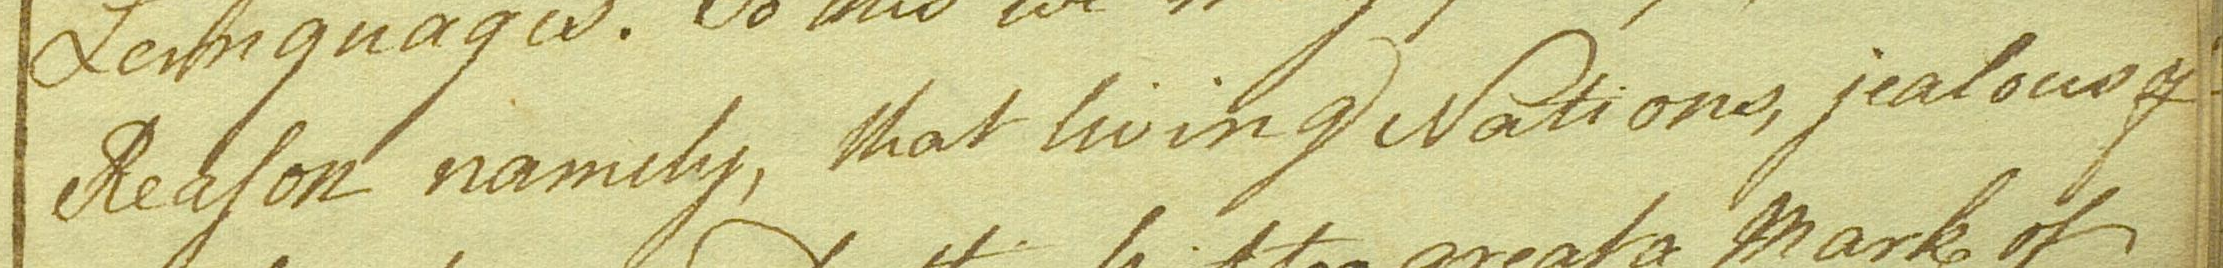Reason namely, that living Nations, jealous of
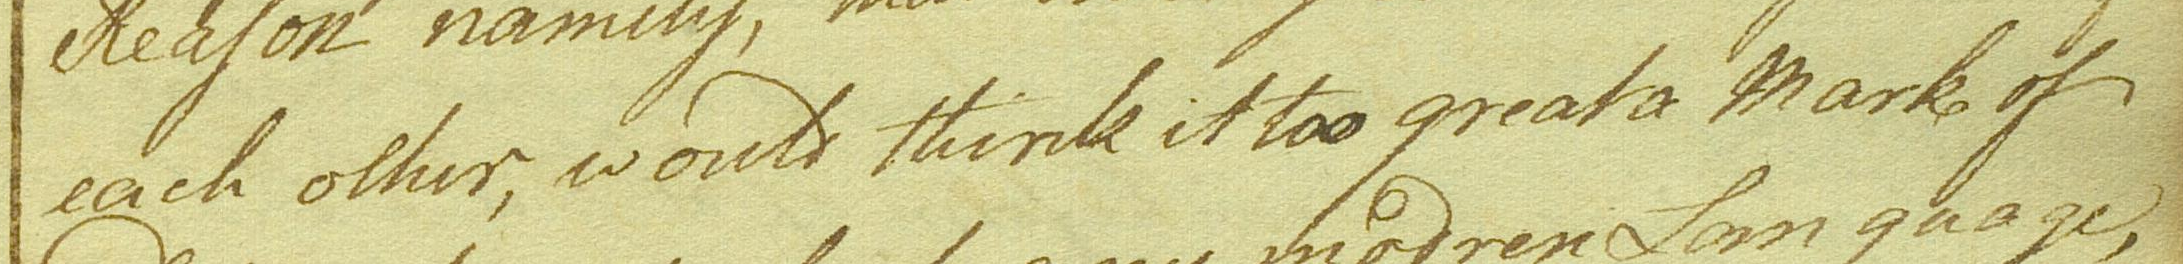each other, would think it too great a Mark of
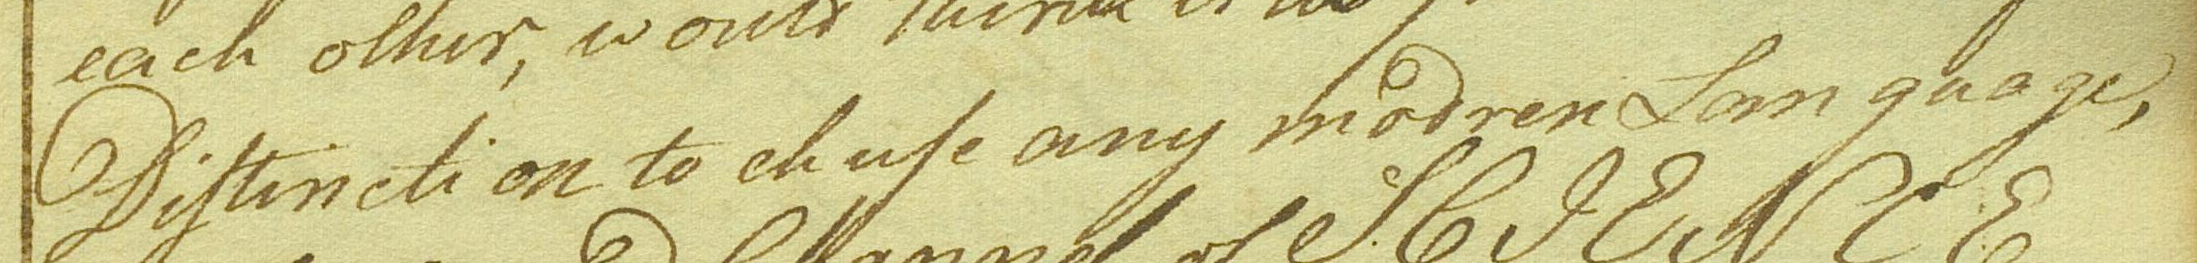Distinction to chuse any modren Language,
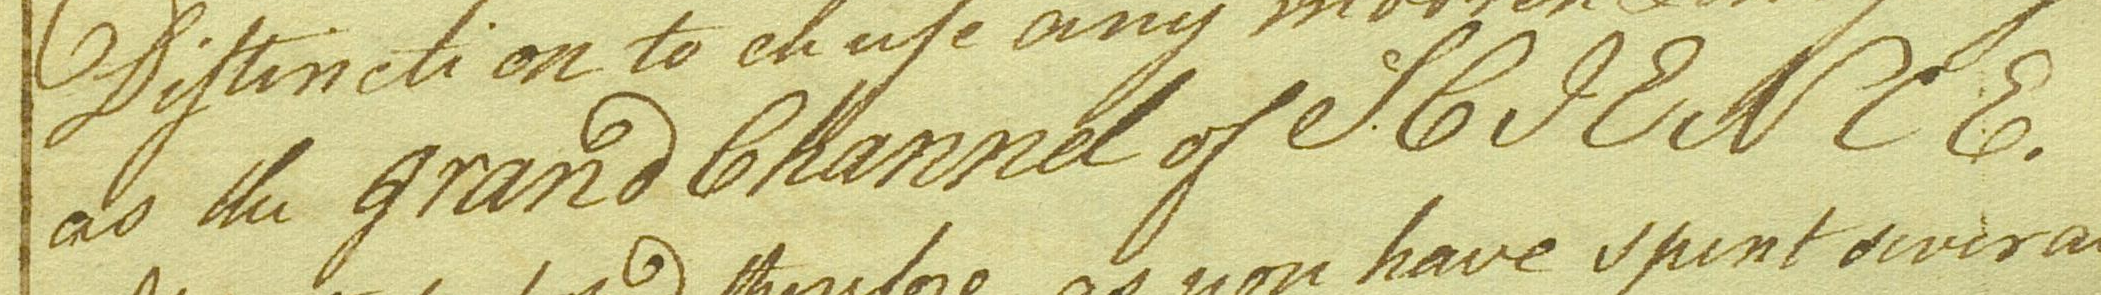as the grand Channel of SCIENCE.
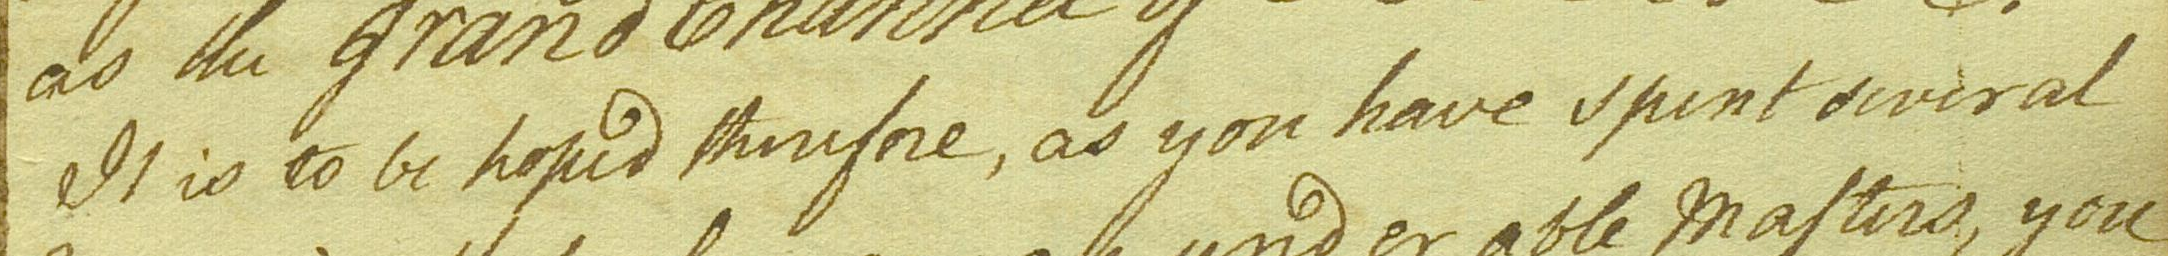It is to be hoped therefore, as you have spent several
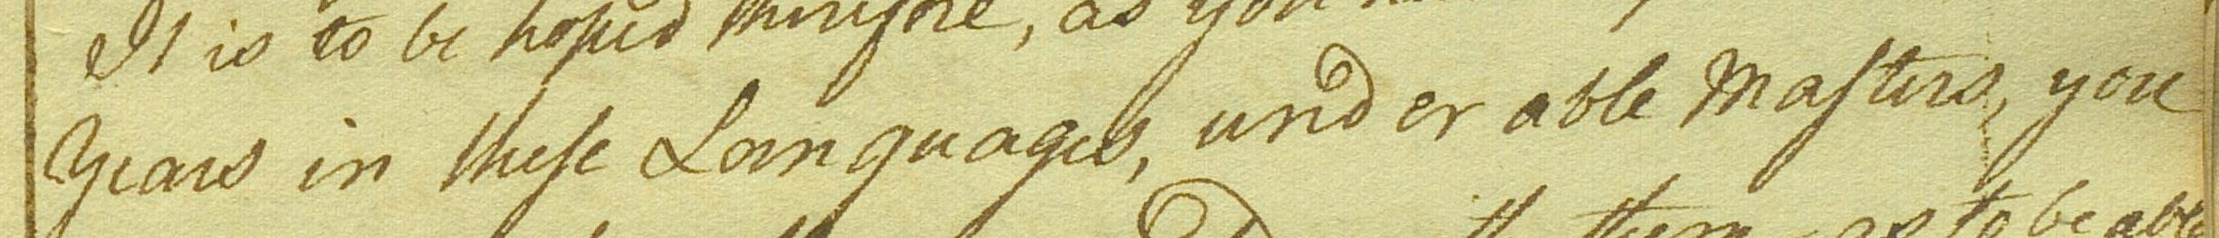years in these Languages, under able Masters, you
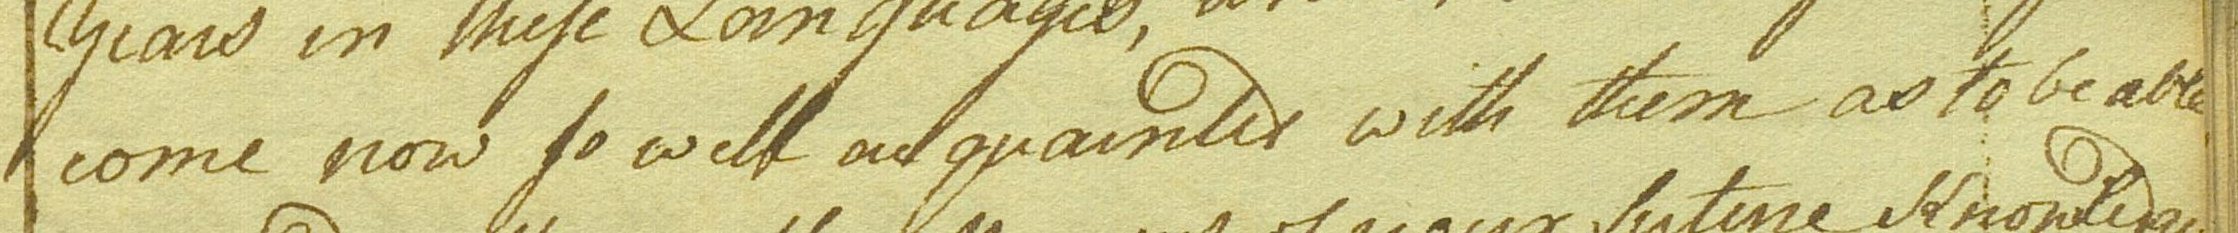come now so well acquainted with them as to be able
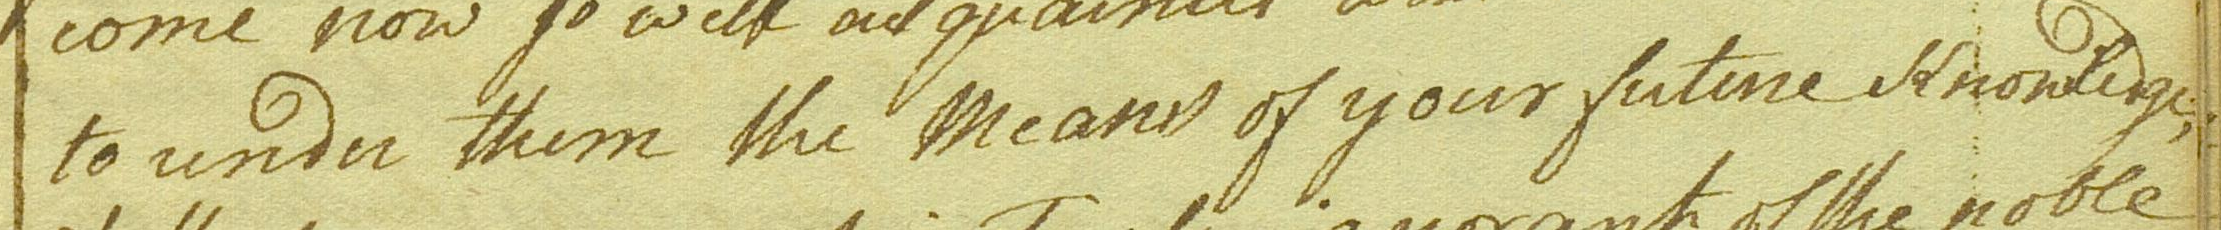to render them the Means of your future Knowledge,
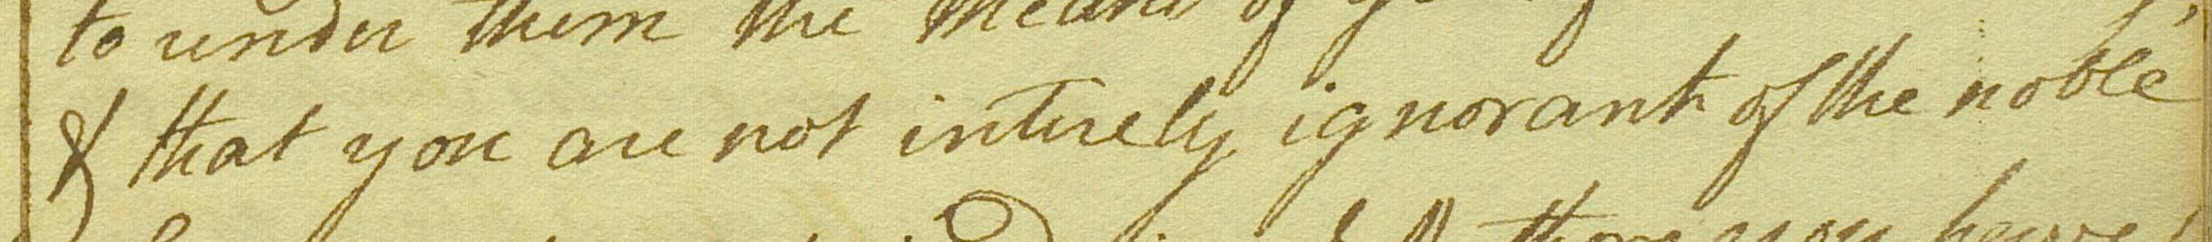& that you are not intirely ignorant of the noble
